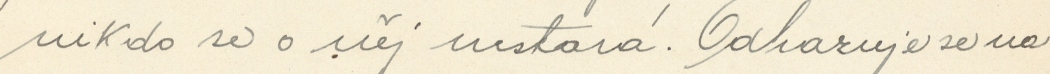nikdo se o něj nestará. Odhazuje se na
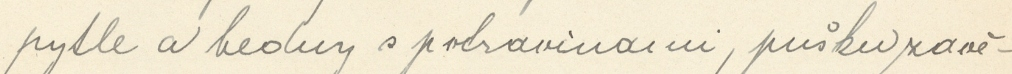pytle a bedny s potravinami, pušku zavě-
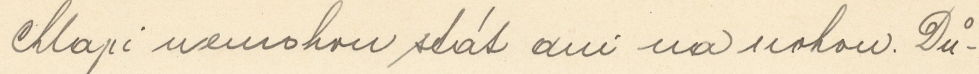Chlapi nemohou stát ani na nohou. Dů-
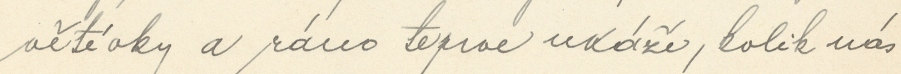větévky a ráno teprve ukáže, kolik nás
